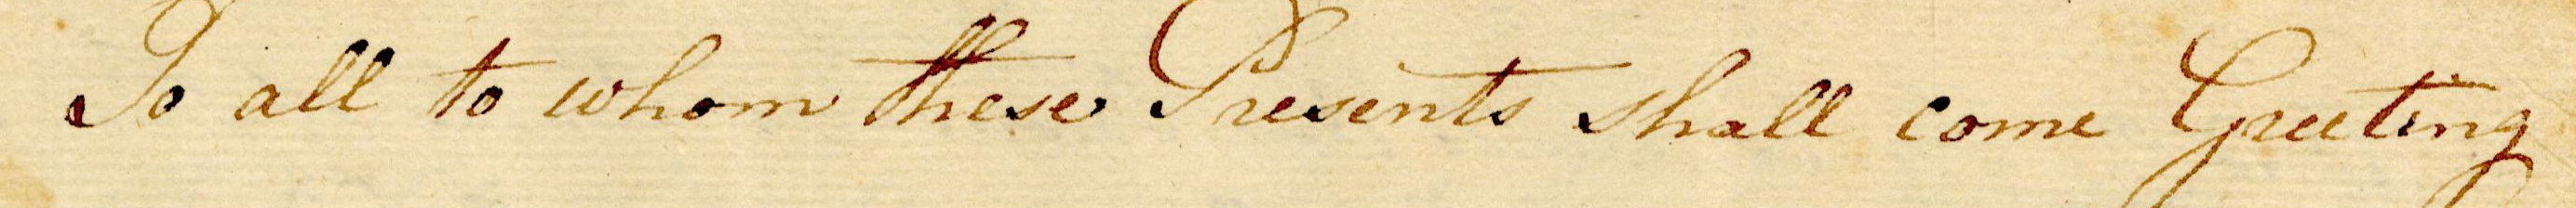To all to whom these Presents shall come Greeting
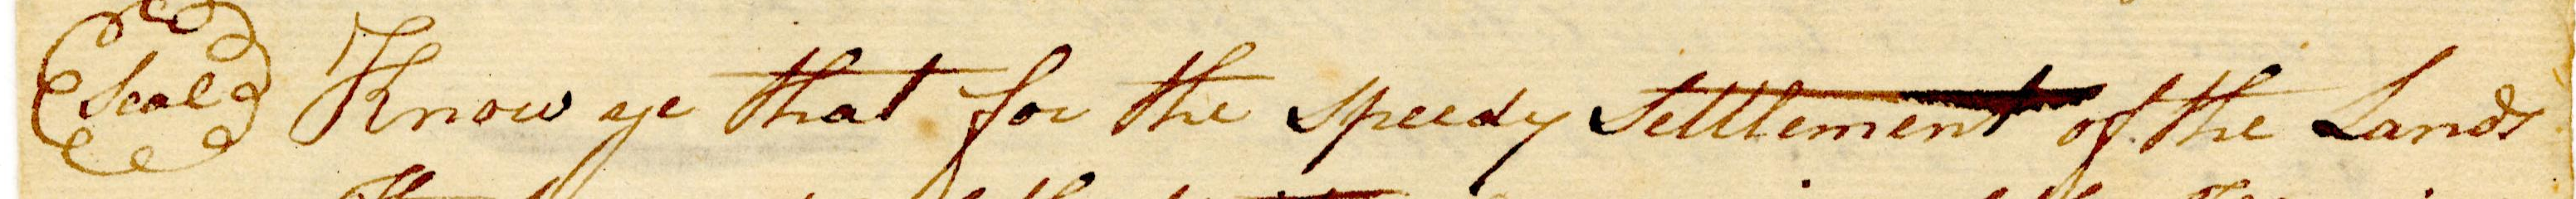seal Know ye that for the speedy Settlement of the Lands
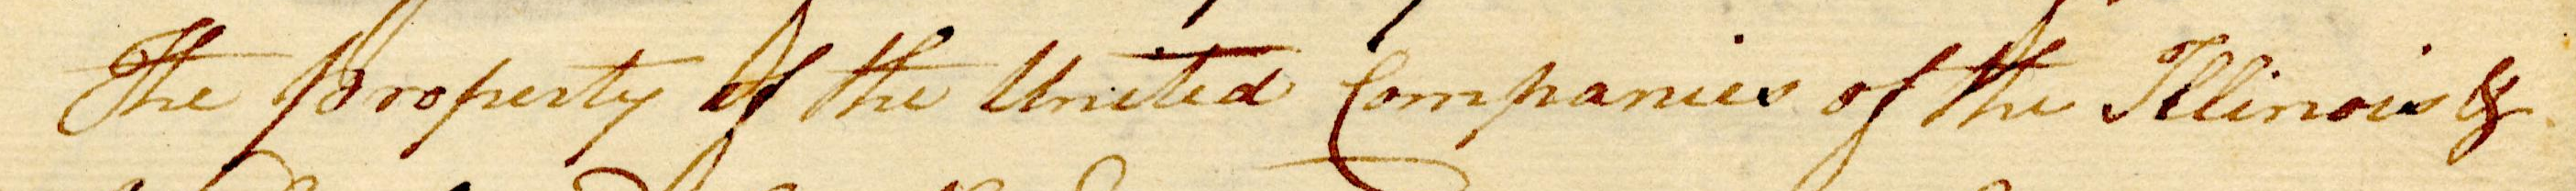The Property of the United Companies of the Illinois &
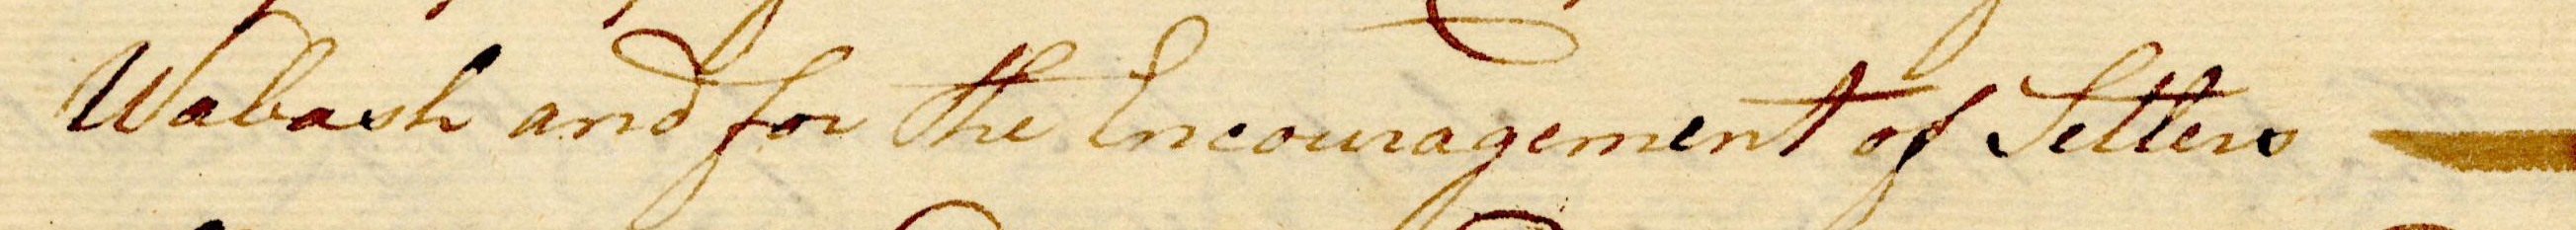Wabash and for the Encouragement of Setters-
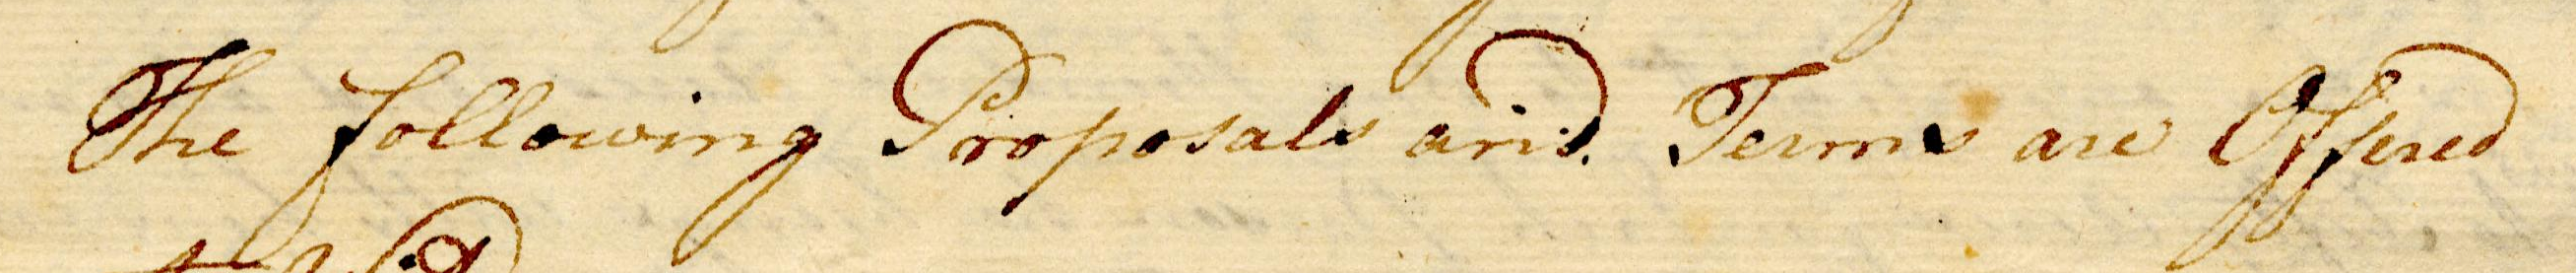The following Proposals and Terms are Offered
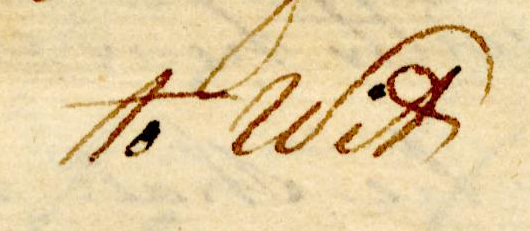to Wit
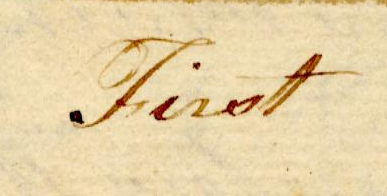First
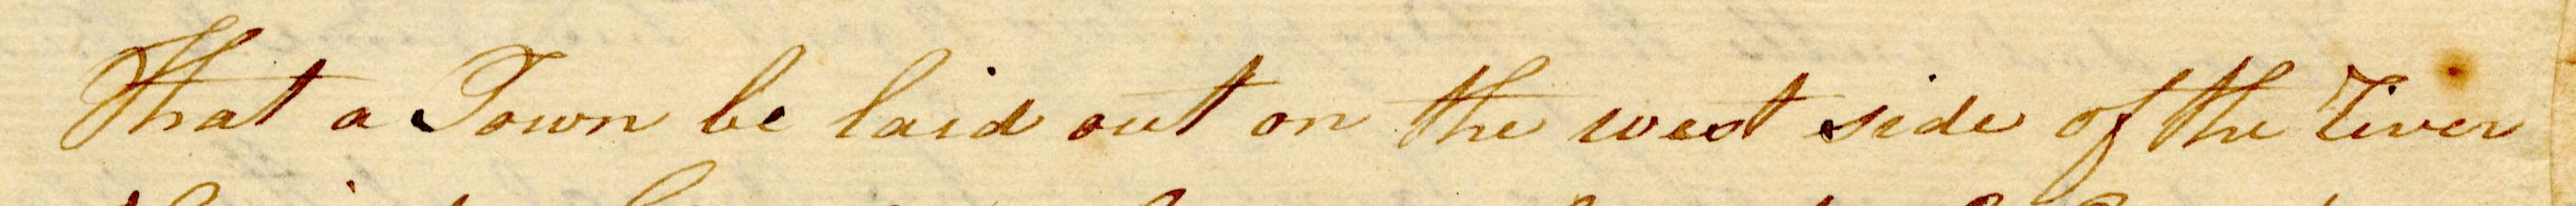That a Town be laid out on the west side of the river
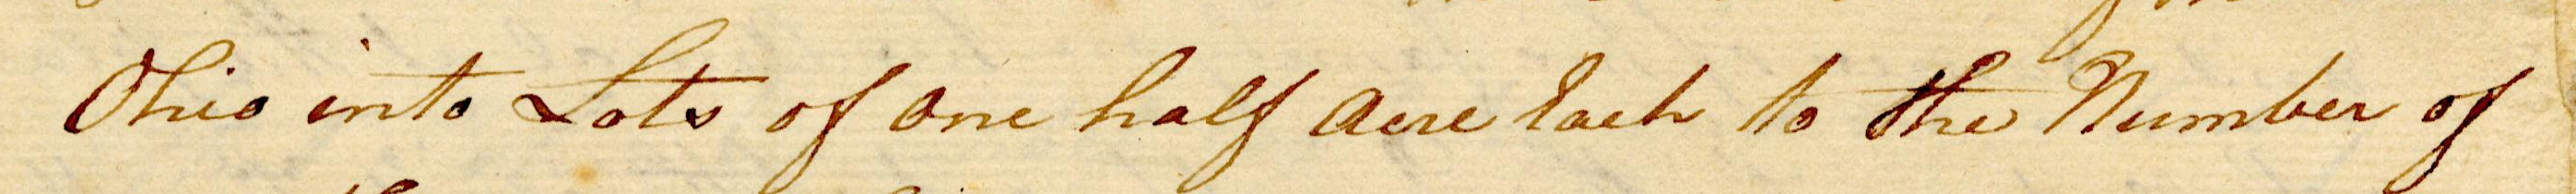Ohio into Lots of one half acre Each to the Number of
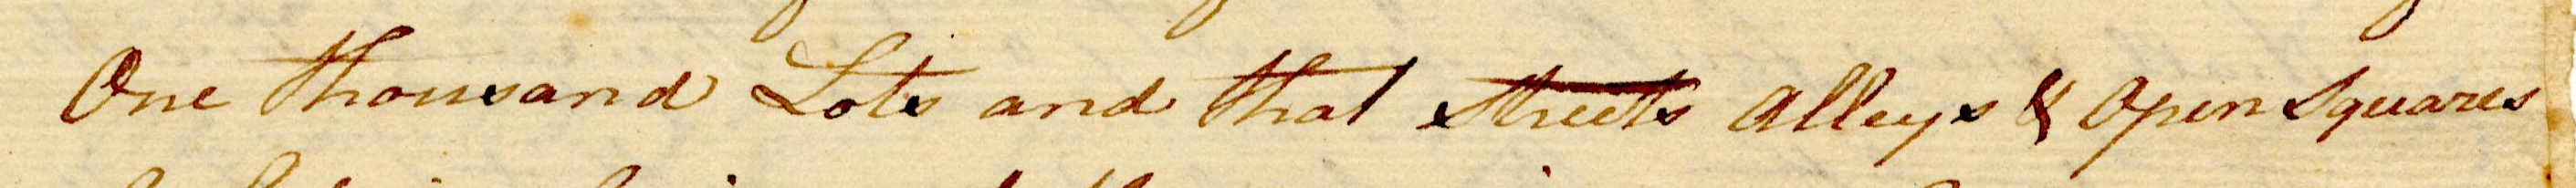One thousand Lots and that [streets] Alleys & Open Squares
